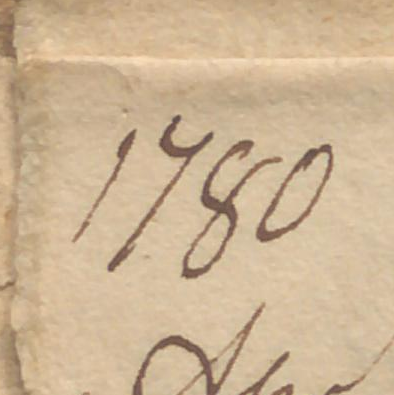1780
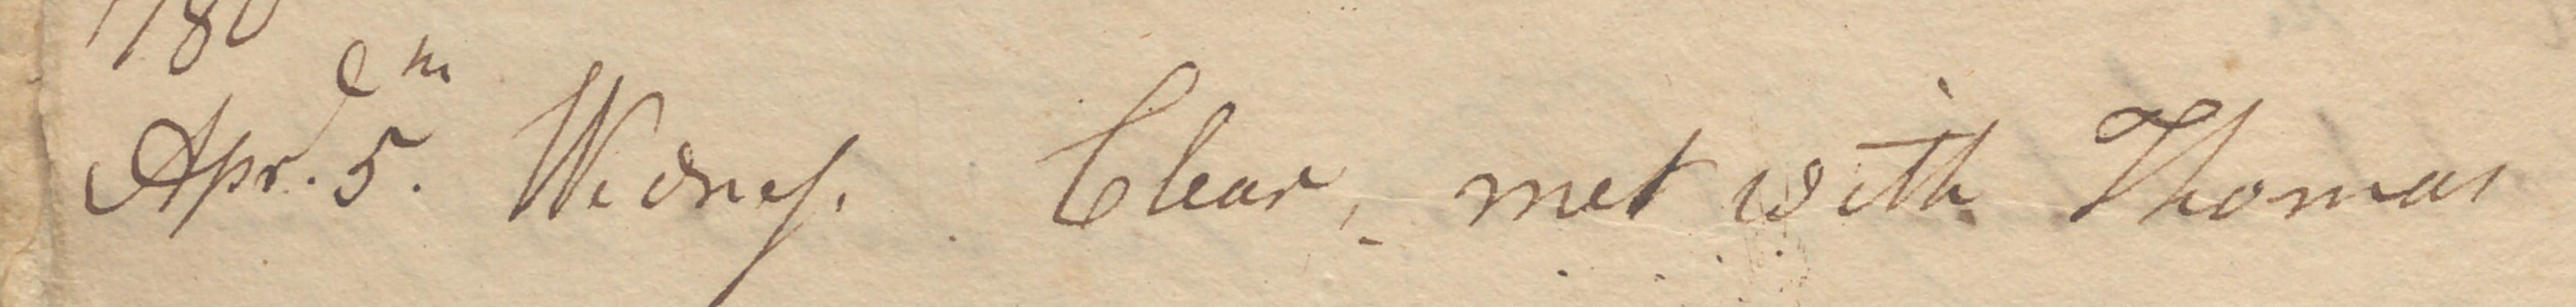Apr. 5^th. Wednes. Clear, met with Thomas
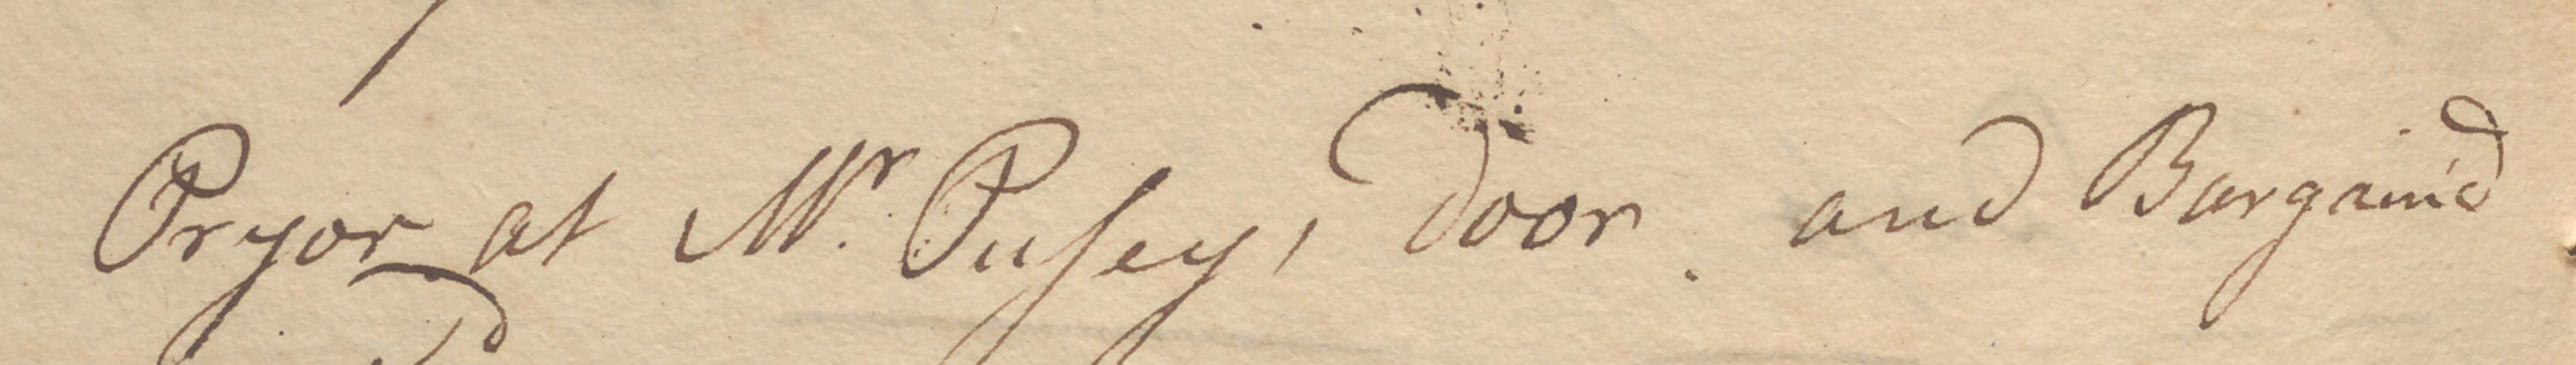Pryor at M^r. Puseys door and Bargained
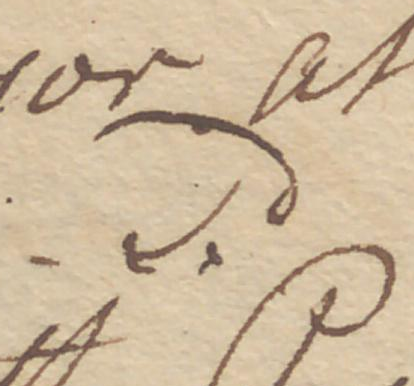s^d.
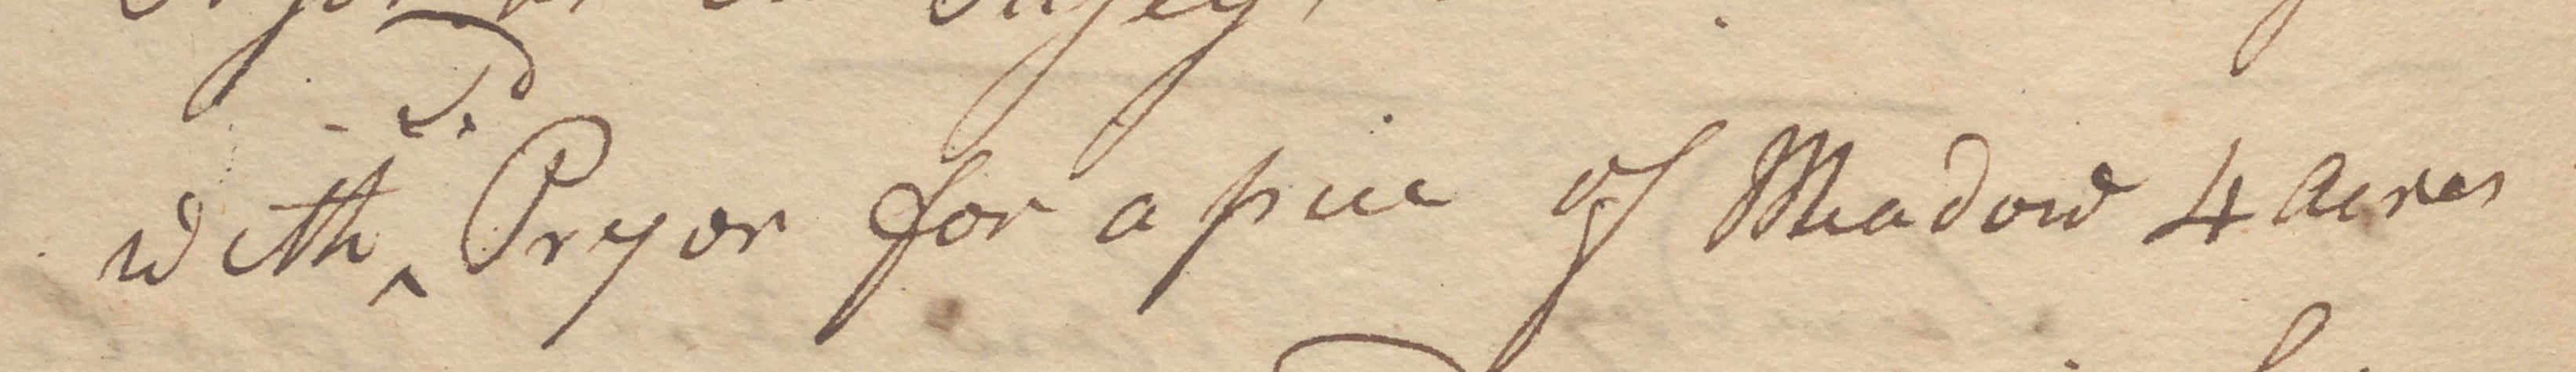with ^ Pryor for a pice of Meadow 4 Acres
